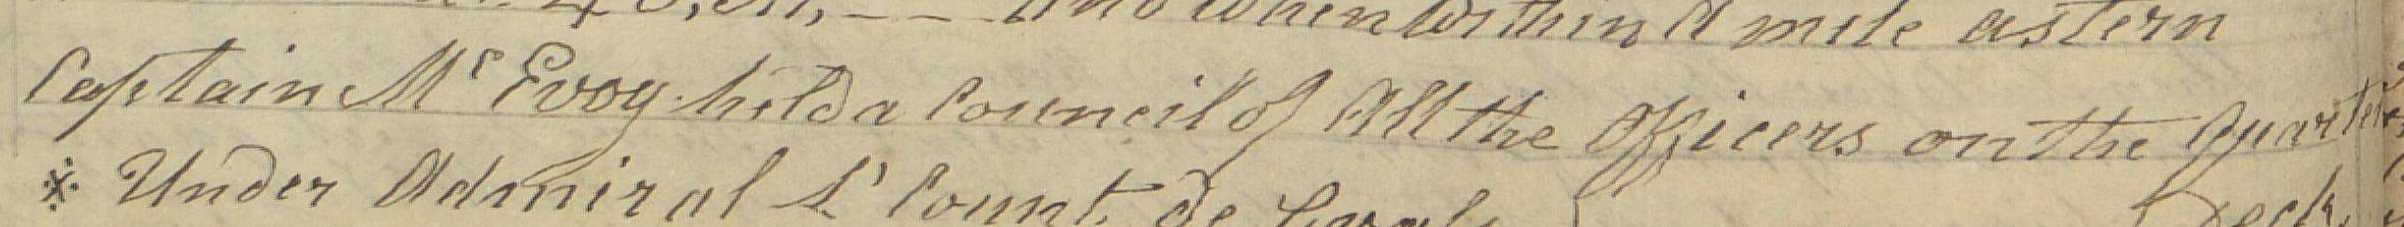Captain M^cEvoy held a Council of All the Officers on the quarter
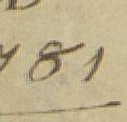1781
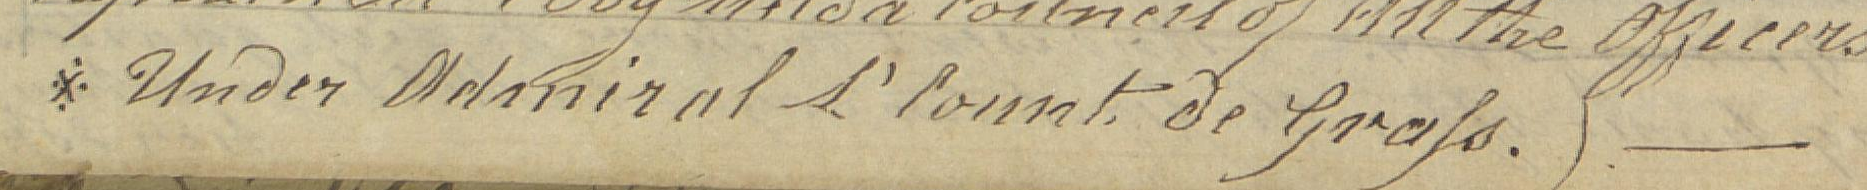& Under Admirals' Count de Gross.)
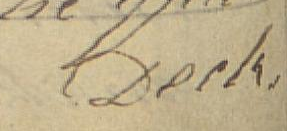Deck
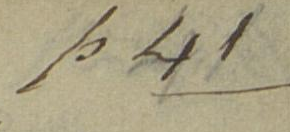p41
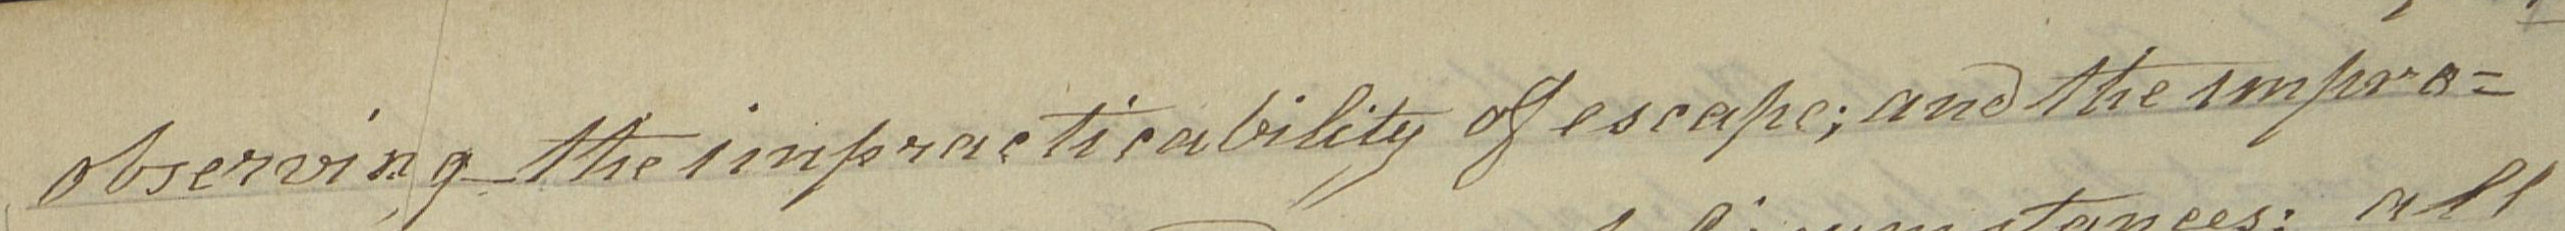observing the impracticability of escape; and the impro-
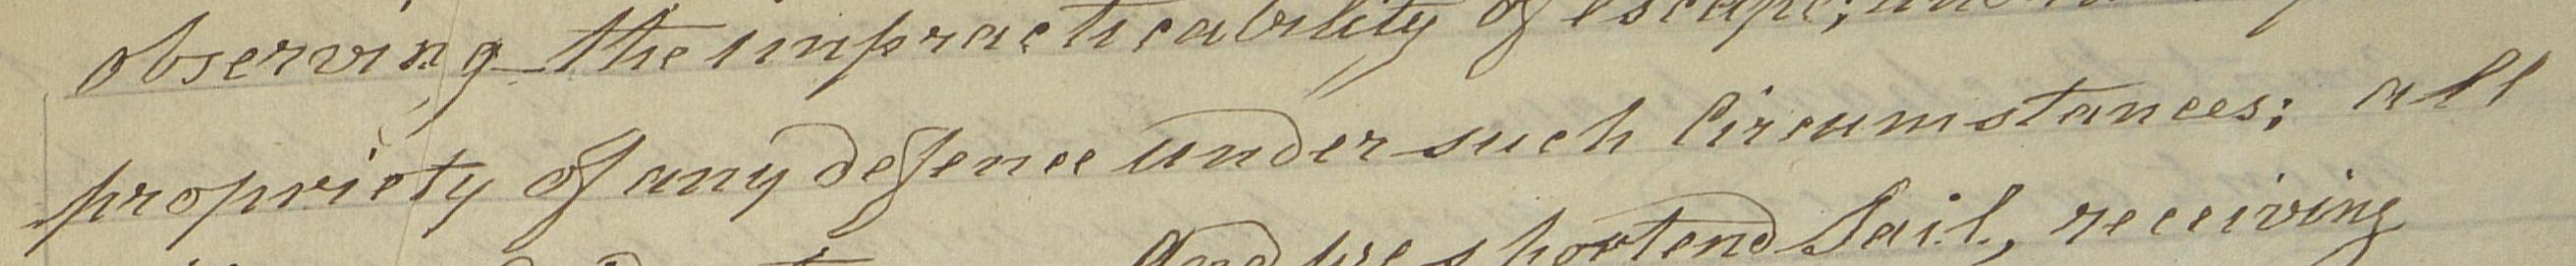propriety of my defence under such Circumstances; all
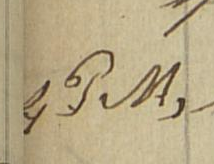4 P M.
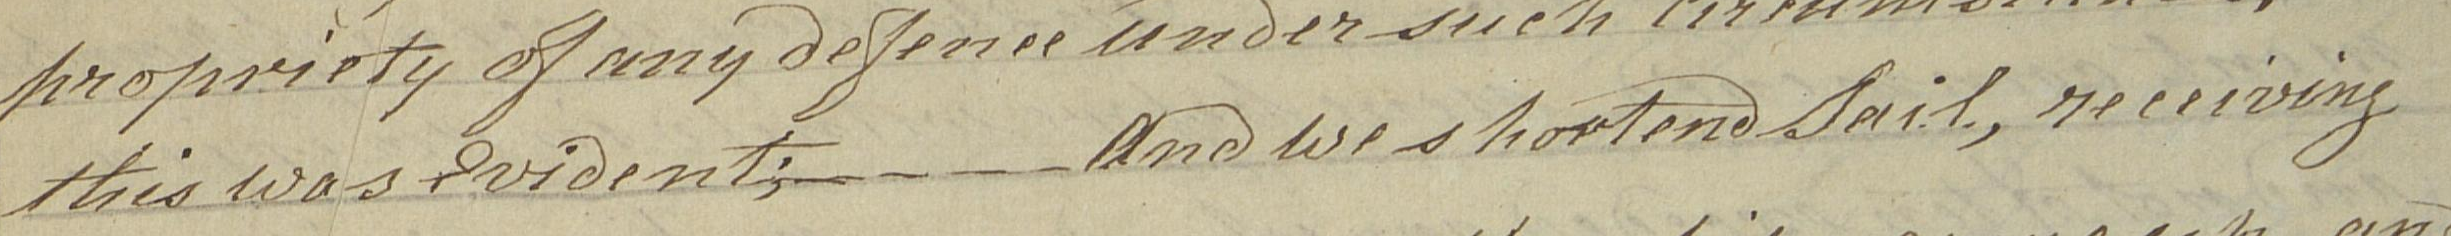this was evident; And was shortend Sail, receiving
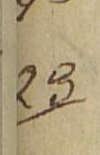23
